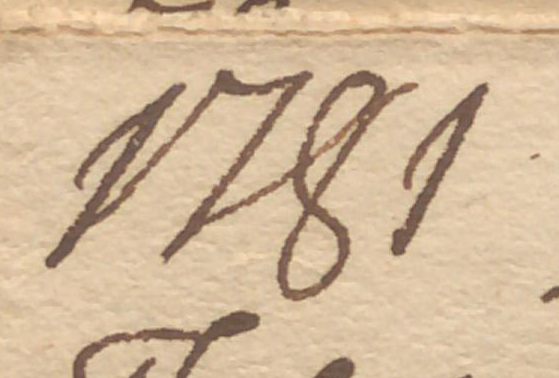1781
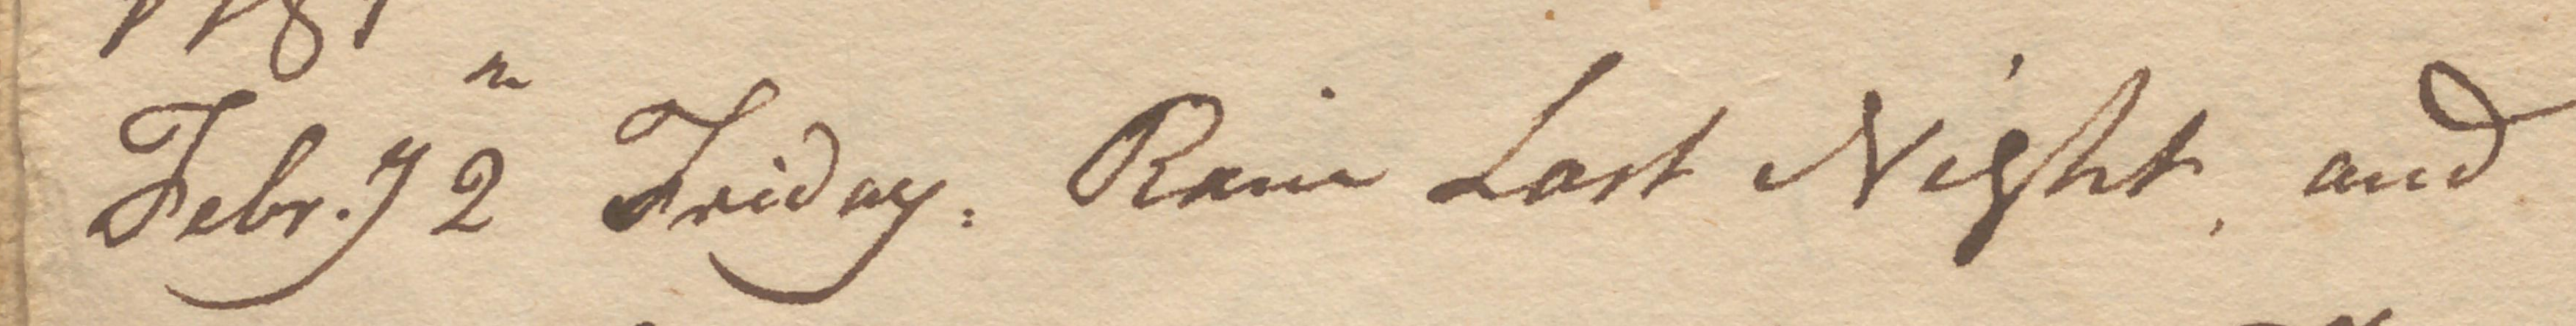Febr^y. 2^th Friday. Rain Last Night and
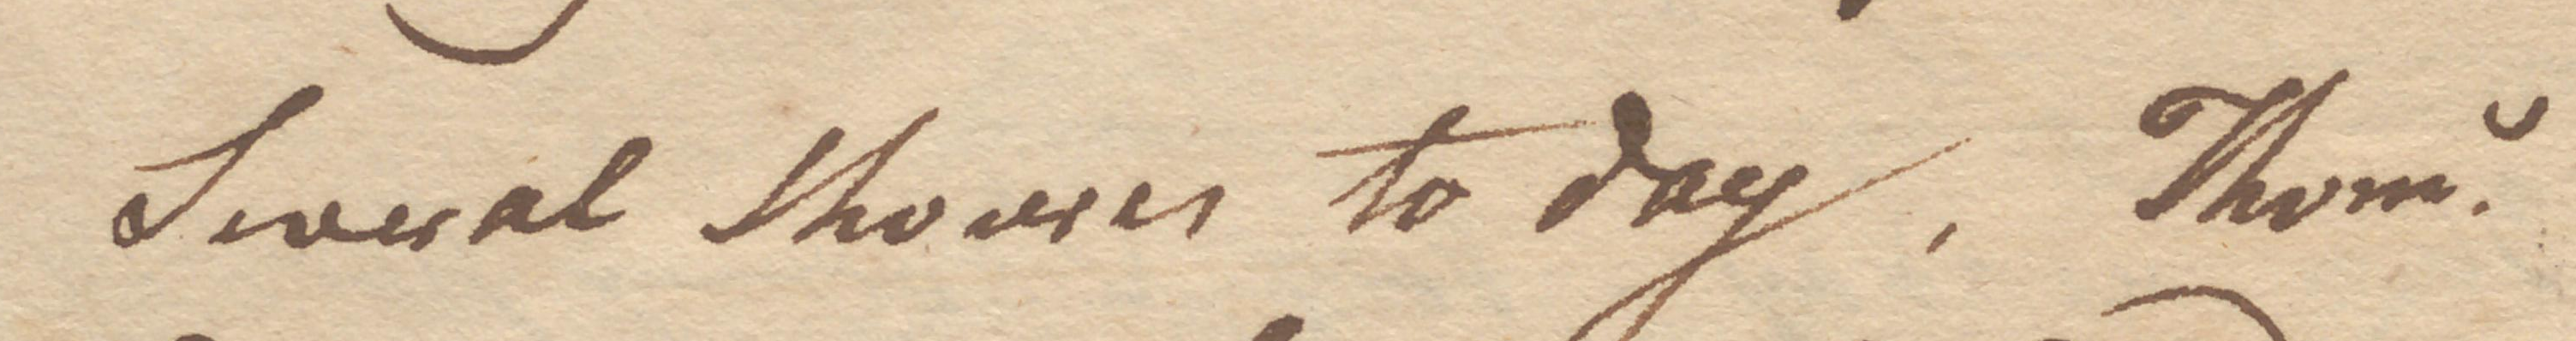Several shoures to day, Thom^s.
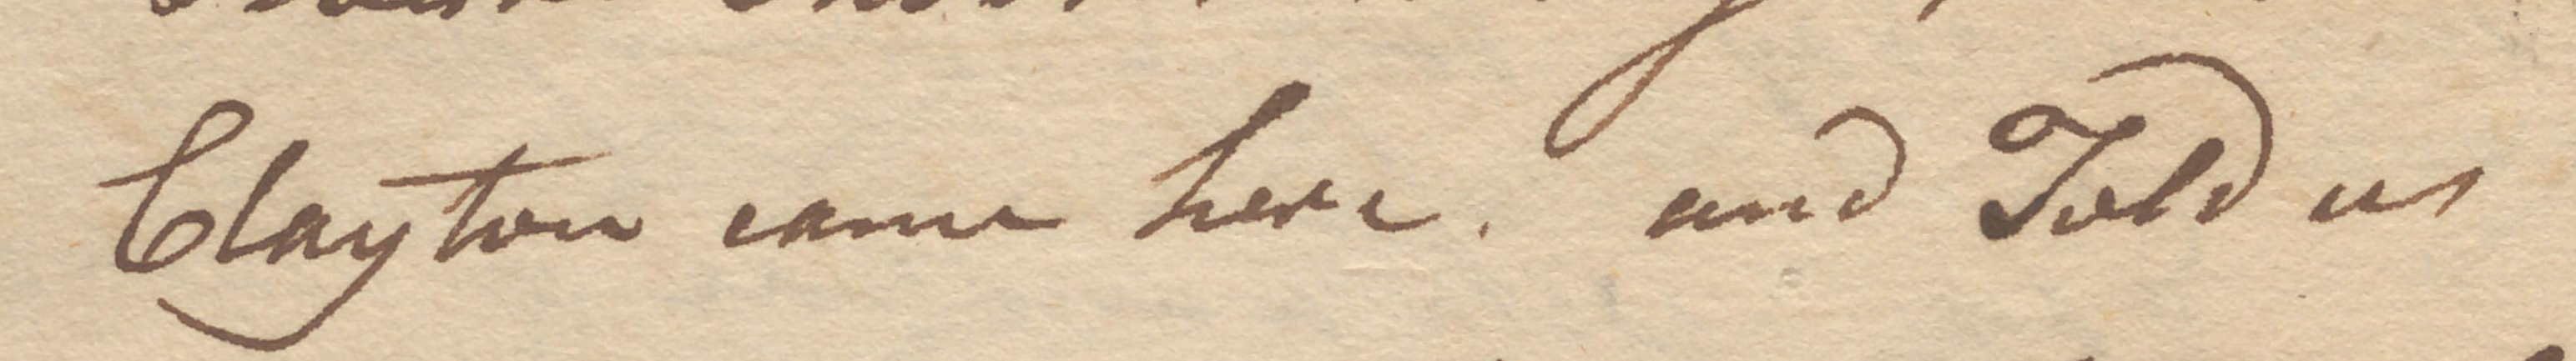Clayton came here. and Told us
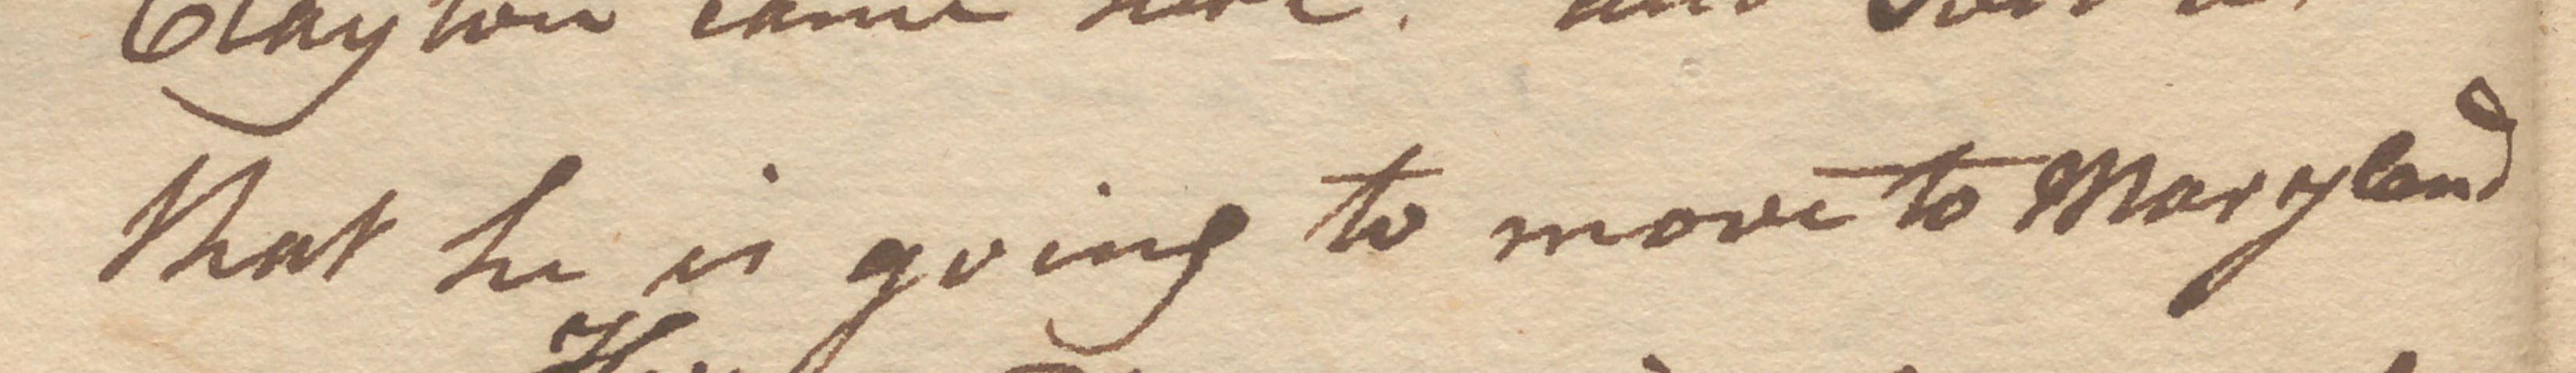that he is going to move to Maryland
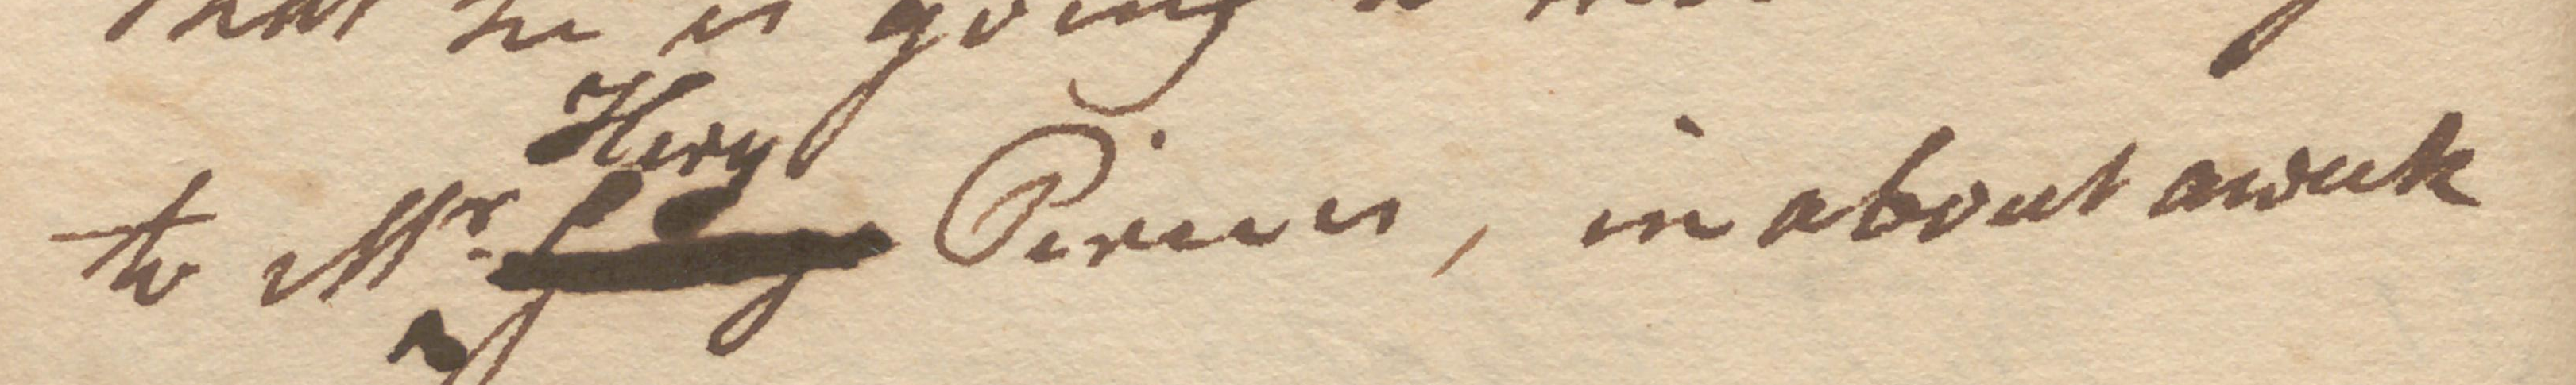to M^r. [George] Pireces, in about a week
